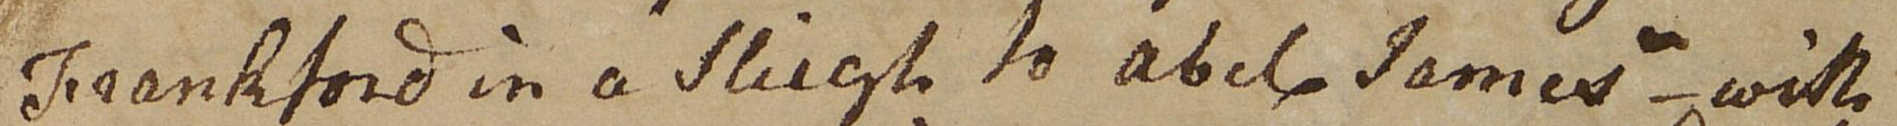Frankford in a sliegh to Abel James^s- with
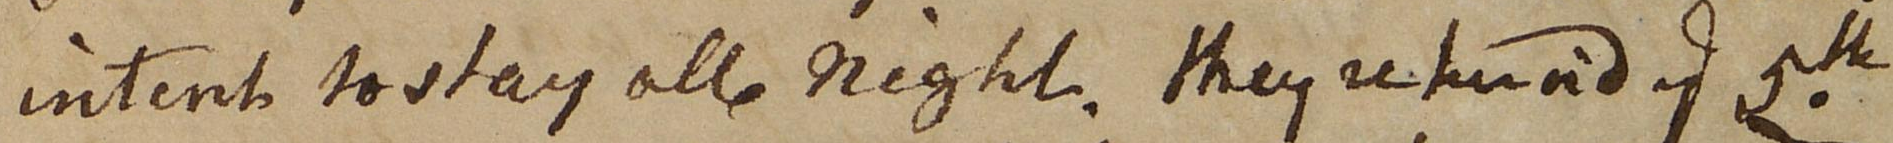intent to stay all night, they return'd y^e 5^th.
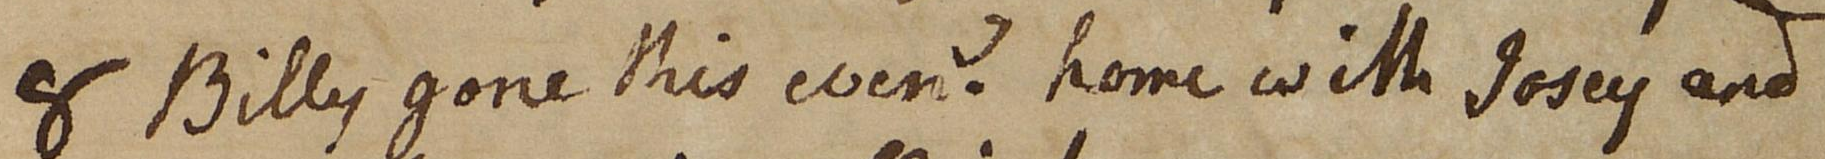8 Billy gone this even^g. home with Josey and
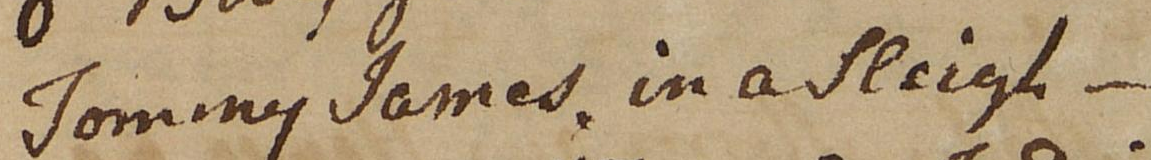Tommy James, in a Sleigh---
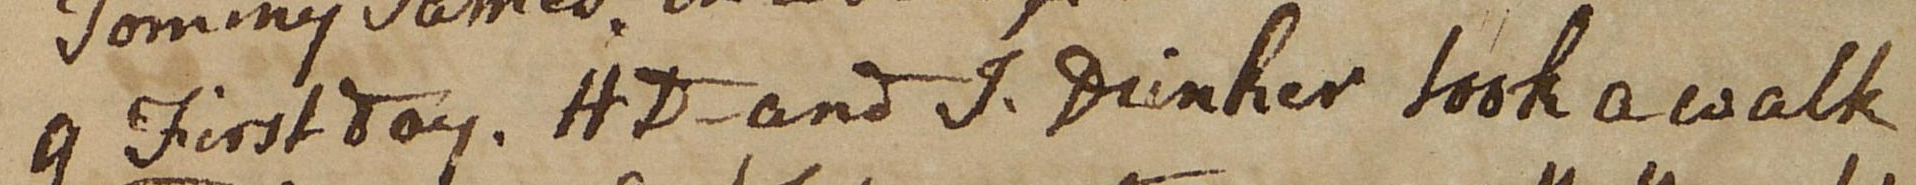9 First day. HD- and I. Drinker took a walk
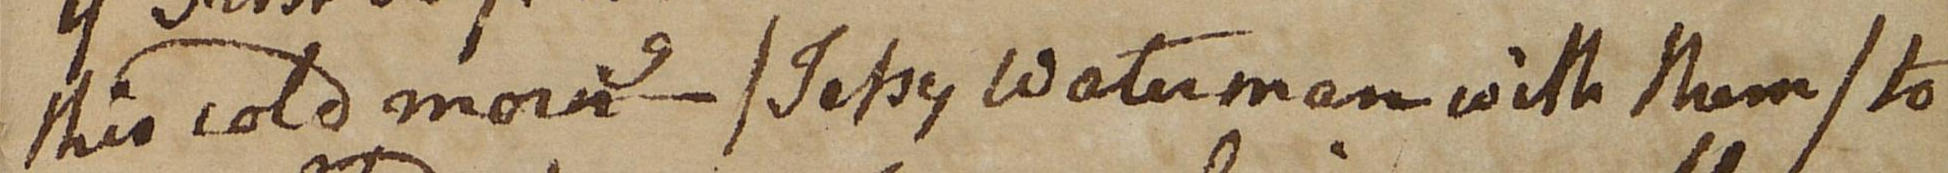this cold morn^g- (Jessy Waterman with them) to
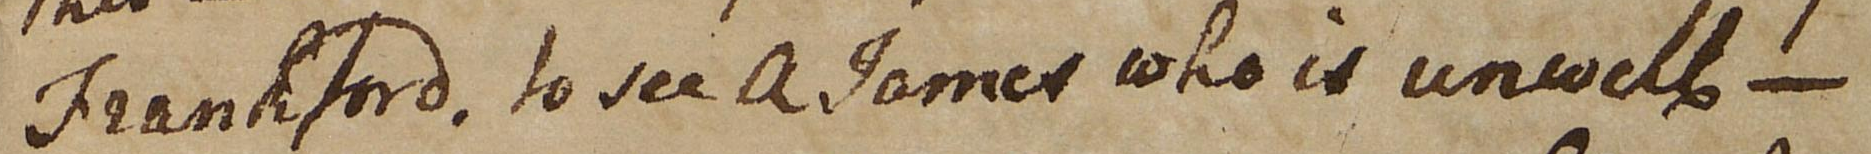Frankford, to see A James who is unwell-
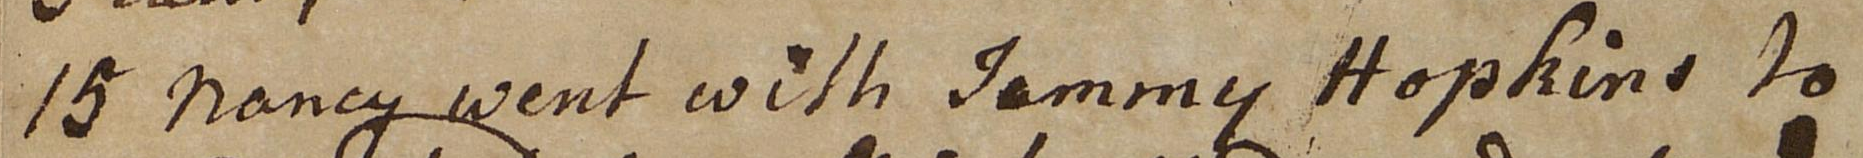15 Nancy went with Jammy Hopkins to
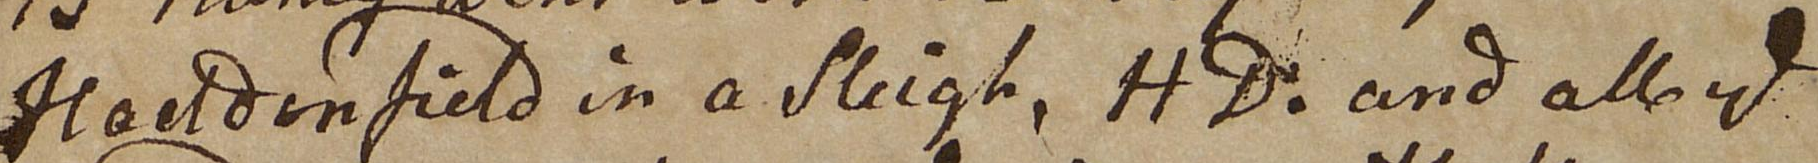Hastdonfield in a Sleigh, HD. and all y^e
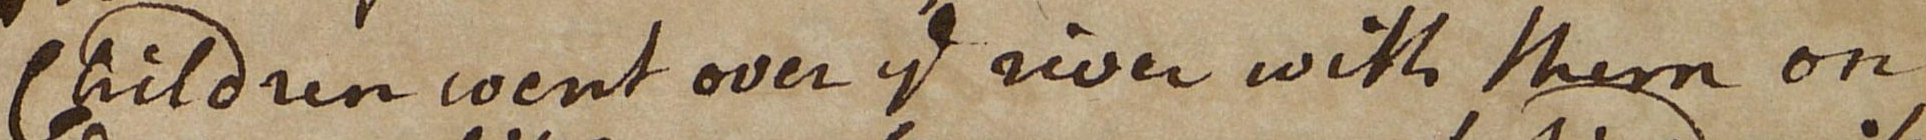Children went over y^e river with them on
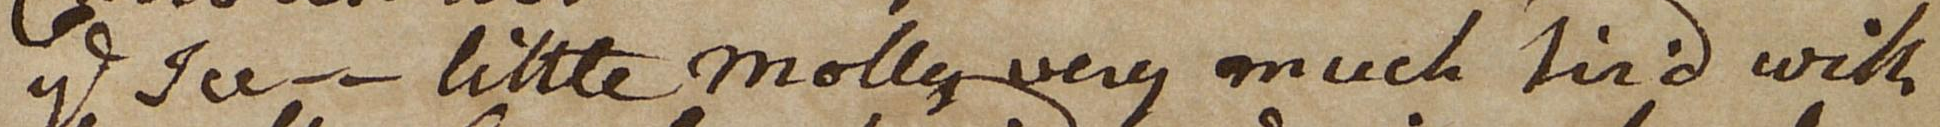y^e Ice-- little Molly very much tir'd with
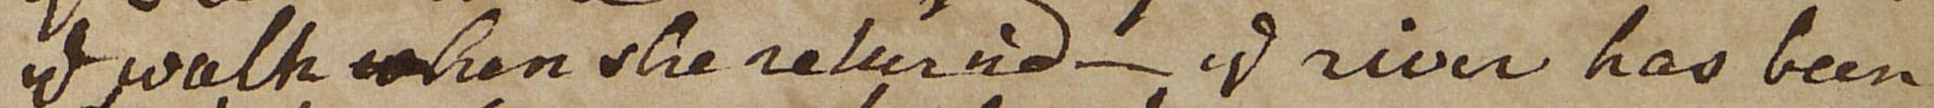y^e walk when she return'd- y^e river has been
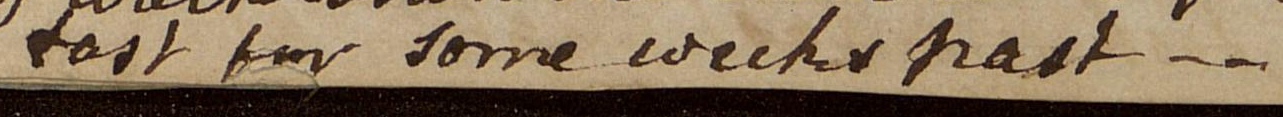fast for some weeks past-
